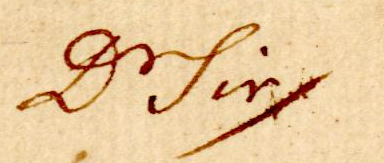D^r Sir,
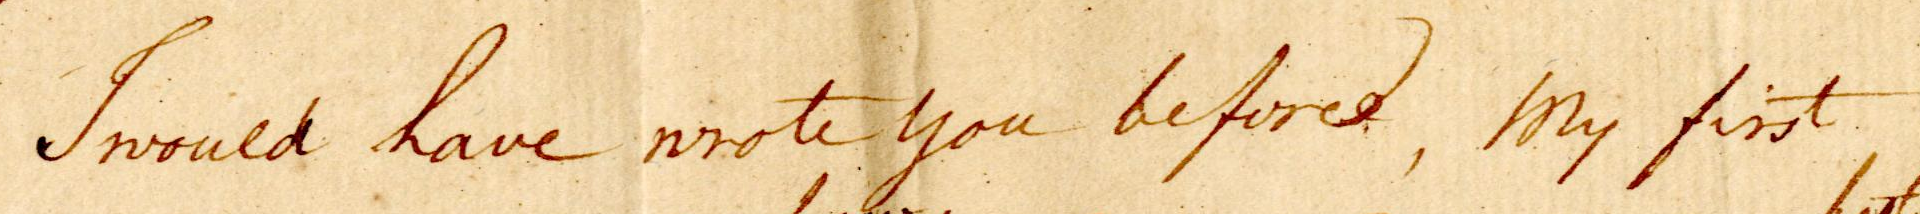I would have wrote you befored, My first
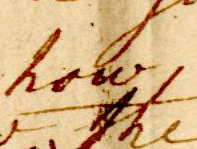how
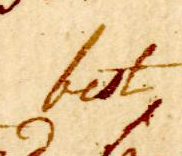best
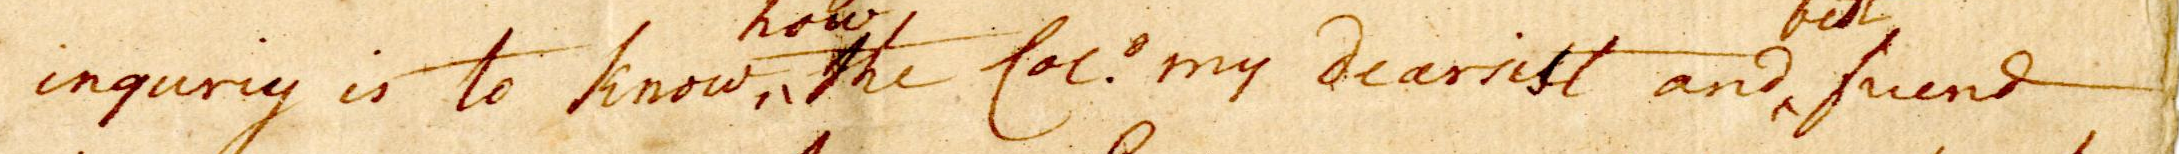inquriy is to know ^ the Col^o. my dearist and ^ friend
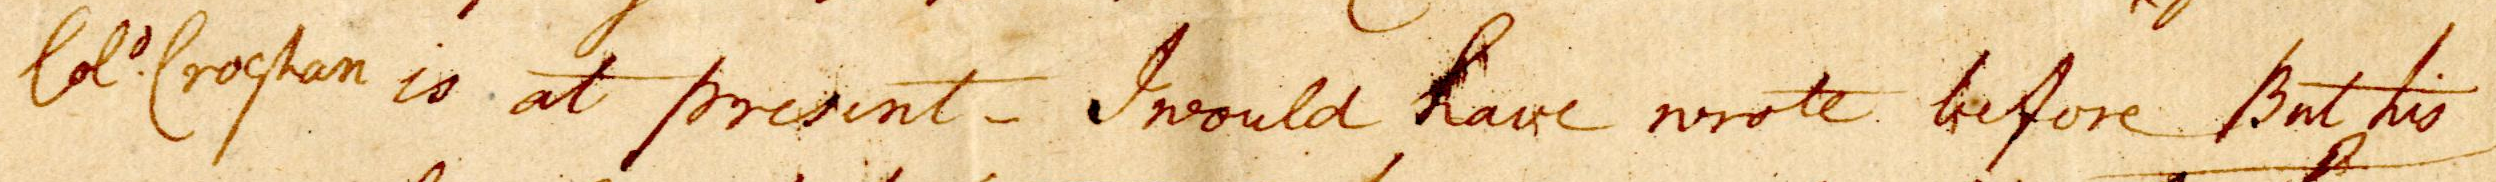Col^o. Croghan is at present- I would have wrote before But his
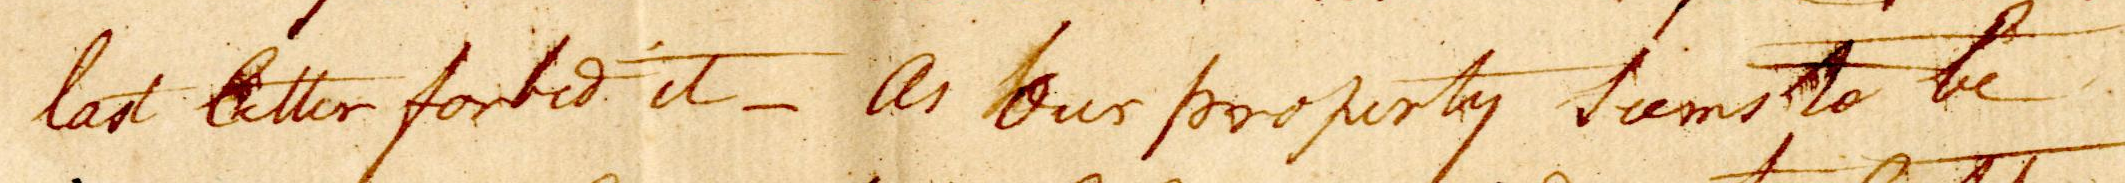last letter forbid it- As our property seems to be
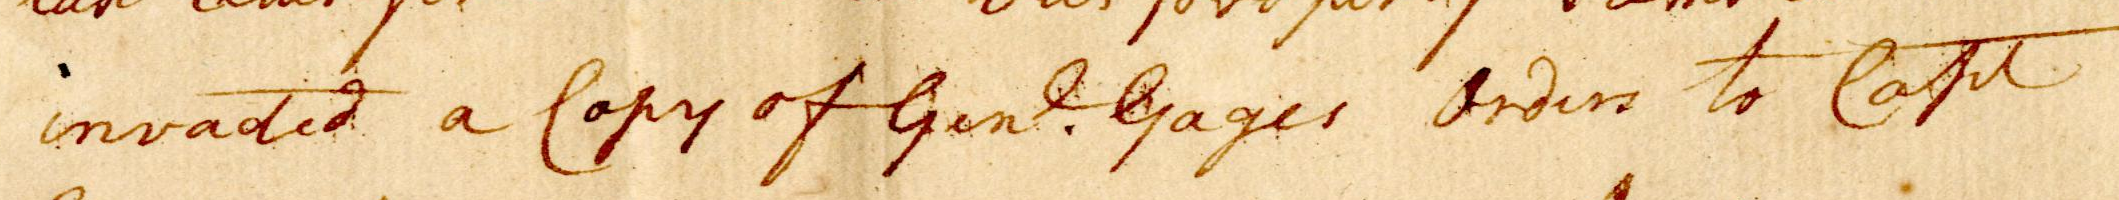invaded a Copy of Gen^l. Gages order to Capt
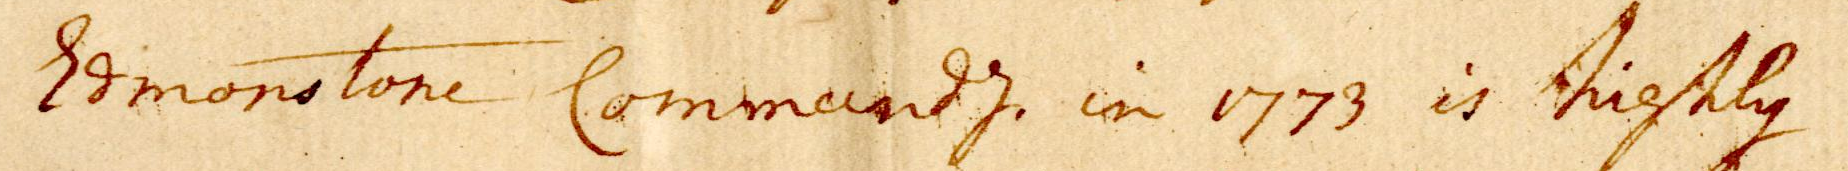Edmonstone Command^g. in 1773 is highly
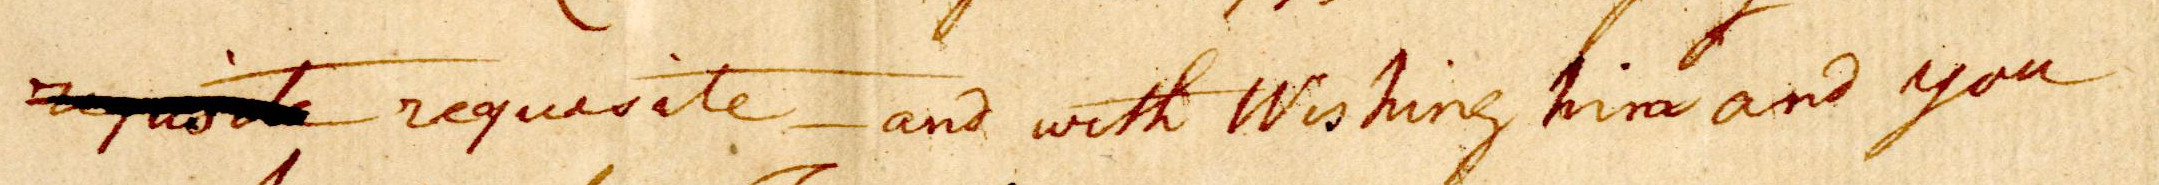[_______] requisite- and with Wishing him and you
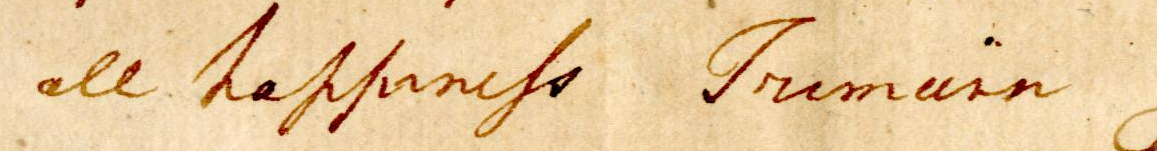all happiness I remain
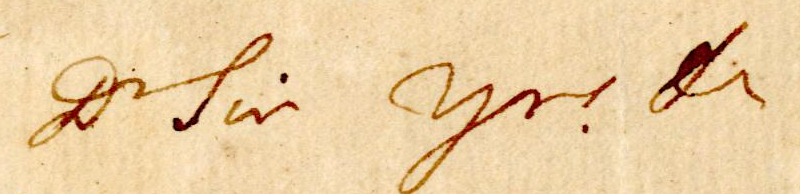D^r Sir Yr^s &
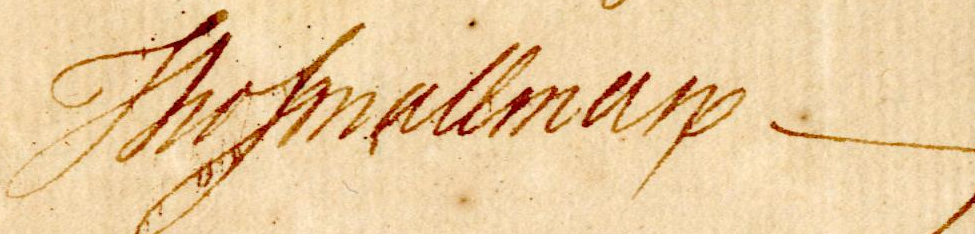Tho Smallman-
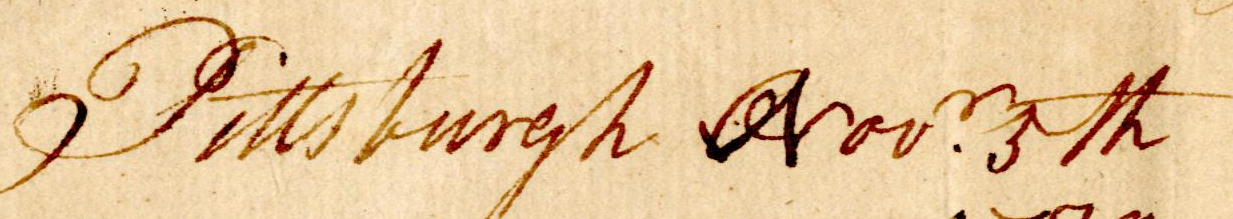Pittsburgh Nov^r. 5th
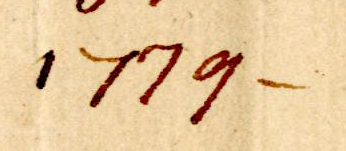1779-
